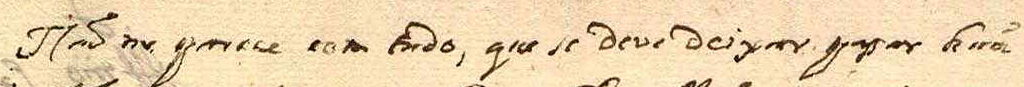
Naõ me parece comtudo, que se deve deixar passar huā
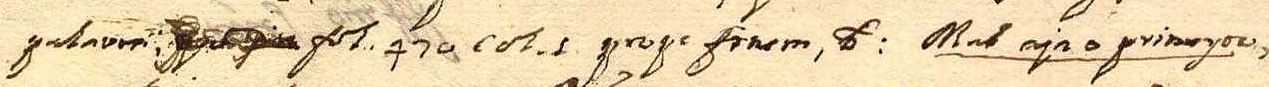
palavra _ fol. 470 col. 5 prope finem, b̄: Mal aja o primeyro,
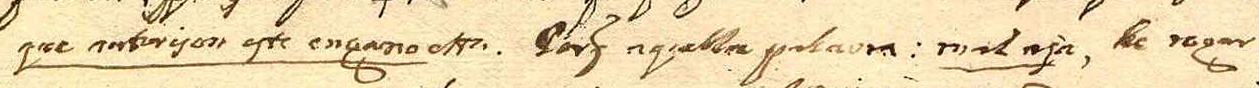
que autorisou este engano etta. Porq̄ aquella palavra: mal aja, he rogar
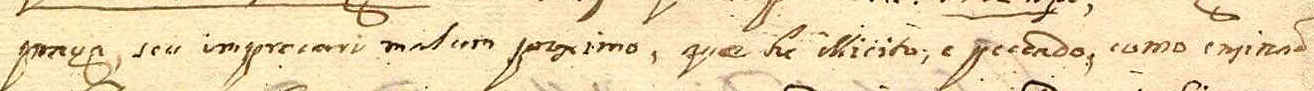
praga, seu imprecari malum proximo, que he illicito; e peccado, como ensinaõ
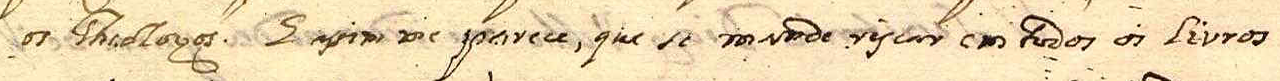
os Theologos. E assim me parece, que se mande riscar em todos os Livros
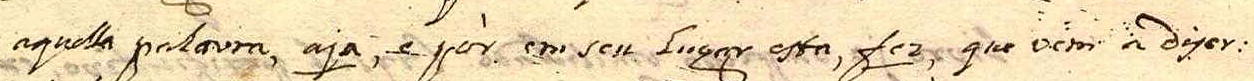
aquella palavra, aja, e por em seu Lugar esta, fez, que vem a diser:
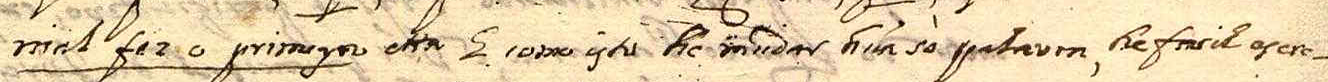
mal fez o primeyro etta E como isto he mudar huā so palavra, he fasil escre
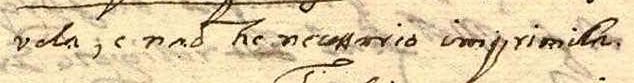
vela, e naõ he necessario imprimilla.
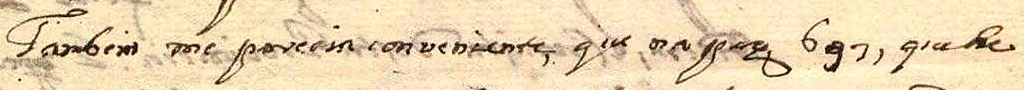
Tambem me parecia conveniente, que na pag 697, que he
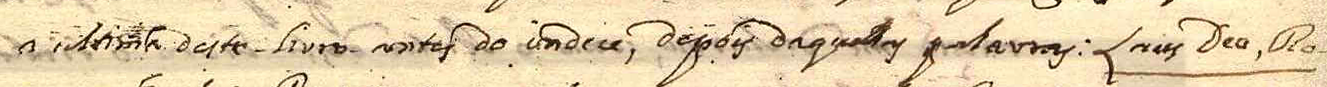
a ultima deste livro antes do indece, depois daquellas palavras: Laus Deo, Ro
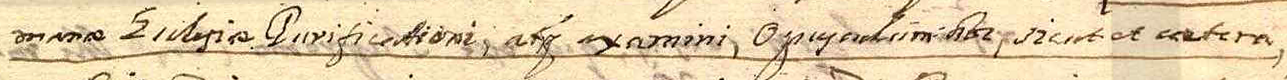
manæ Ecclesiæ Purificattioni, atq̄ examini, Opusculum hoc, sicut et cætera,
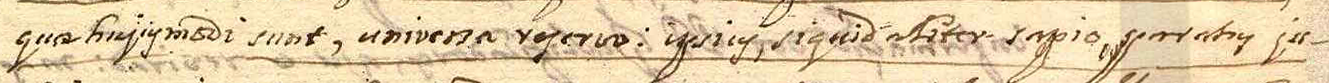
quæ hujusmodi sunt, universa reservo: ipsius si quid aliter sapio, paratus ju
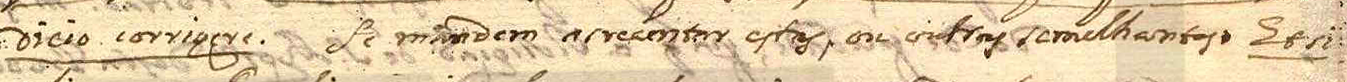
dicio corrigere. Se mandem acrecentar estas, ou outras semelhantes, Et si
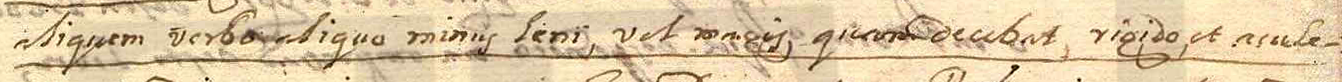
aliquem verbo aliquo minus leni, vel magis, quam decebat rigido, et acule
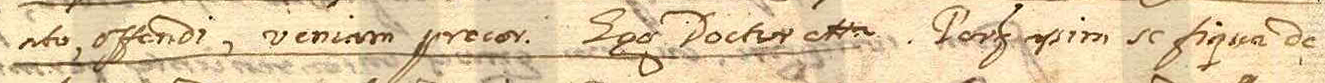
ato, offendi, veniam precor. Ego Doctor ett.a. Porq̄ assim se fiqua de
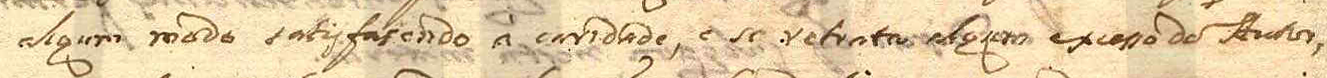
algum modo satisfasendo à caridade, e se retrata algum excesso do Autor,
